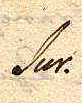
Iur.
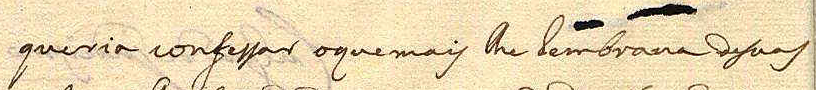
queria confessar o que mais lhe lembraua de suas
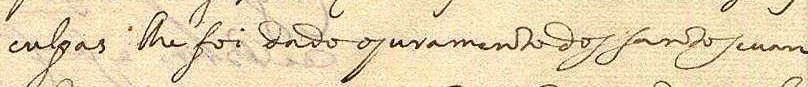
culpas lhe foi dado o juramento dos santos euan
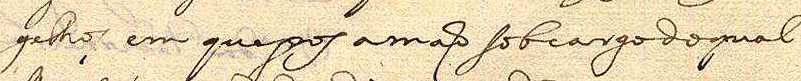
gelhos em que pos a maõ sob cargo do qual
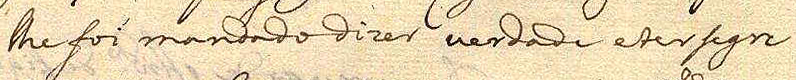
lhe foi mandado dizer uerdade e ter segre
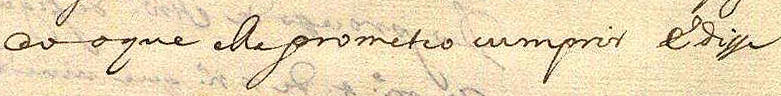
do o que elle prometeo cumprir e disse
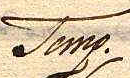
Temp.
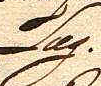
Lug.
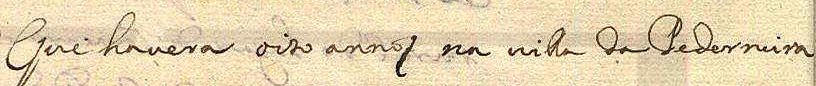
Que hauera oito annos na uilla da Pederneira
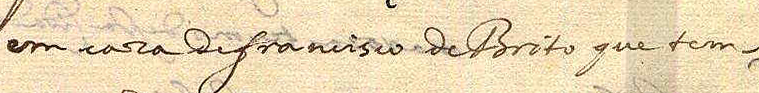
em caza de francisco de Brito que tem
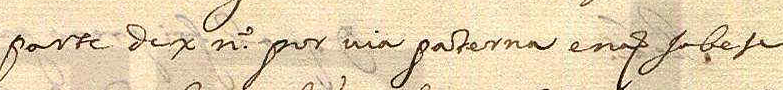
parte de x n.o por uia paterna e naõ sabe se
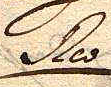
Reo
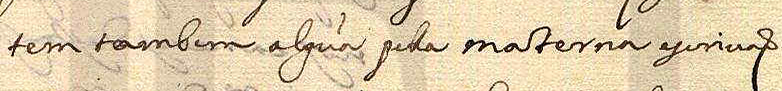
tem tambem alguā pella materna escriuaõ
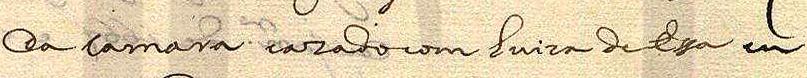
da camara cazado com luiza de essa cu
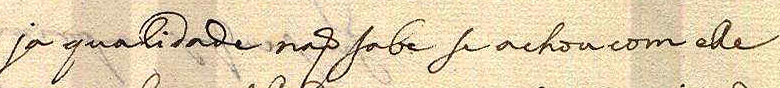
ja qualidade naõ sabe se achou com elle
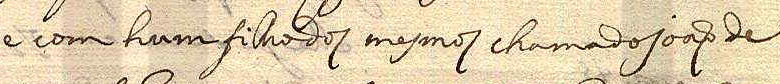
e com hum filho dos mesmos chamado joaõ de
